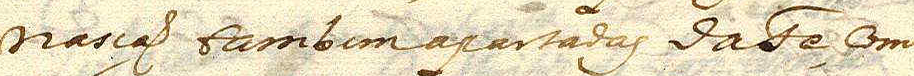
nasçaõ tambem apartadas da Fe, com
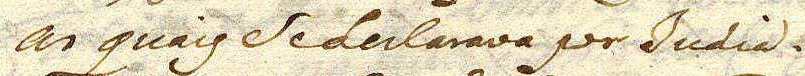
as quais Se declarava por Iudia.
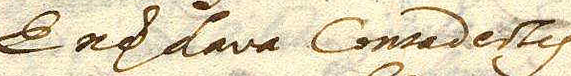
E naõ dava Conta destes
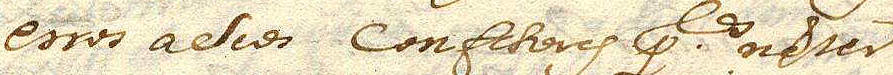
erros a Seos Confessores p.los naõ ter
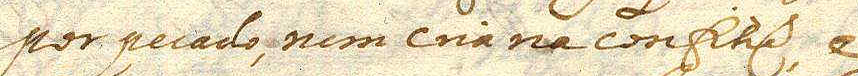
por pecado, nem cria na confisaõ, e
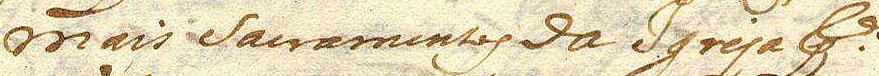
mais Sacramentos da Igreja p.los
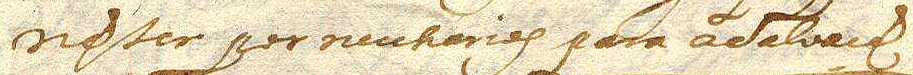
naõ ter por necessarios para a Salvaçaõ
